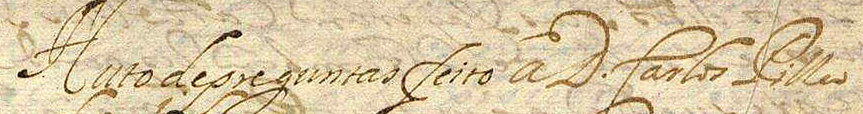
Auto de preguntas feito a D. Carlos Pilla
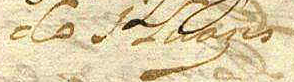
do ILuazes
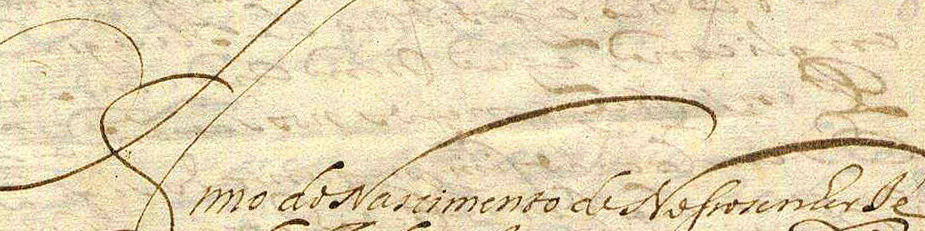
Anno do Nascimento de Nosso senhor Ie
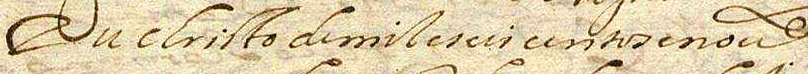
zu christo de mil e seiscentos e noute
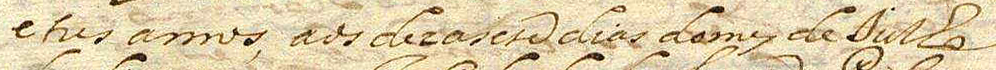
e tres annos, aos dezasete dias do mes de Iulho
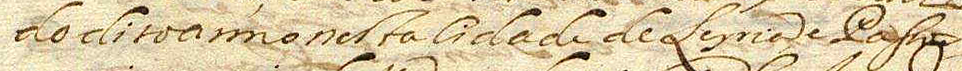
do dito anno nesta Cidade de Leyria, e Passos
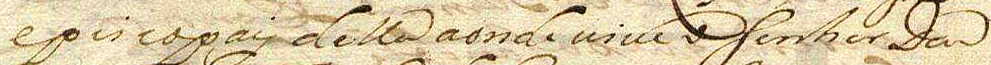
episcopais della aonde uiue o Senhor Dou
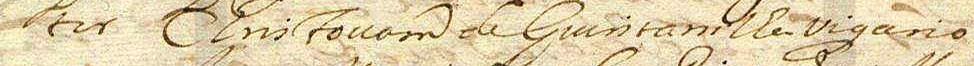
tor Christouam de Quintanilha vigario
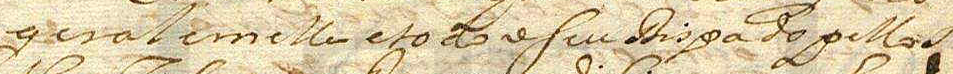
geral em elle e todo o seu Bispado pello I
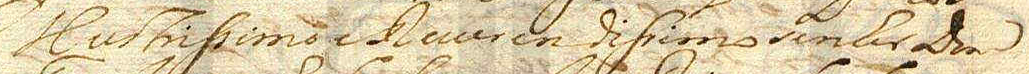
llustrissimo e Reuerendissimo senhor Dom
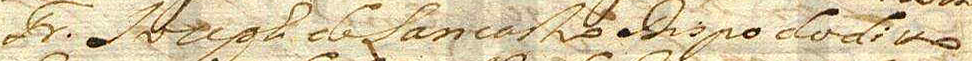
Fr. Jozeph de Lancastro Bispo do ditto
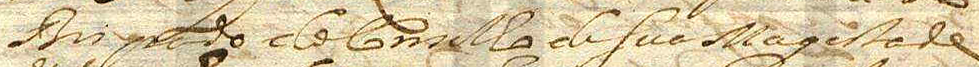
Bispado do Conselho de sua Magestade
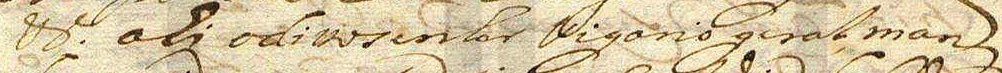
&r.a ahi o ditto senhor Vigario geral man
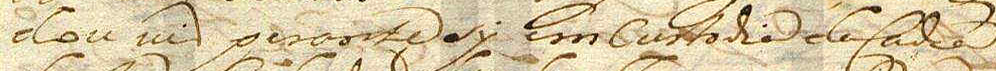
dou uir perante sy em Custodia de Cadea
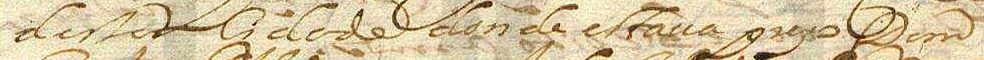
desta Cidade donde estaua prezo Dom
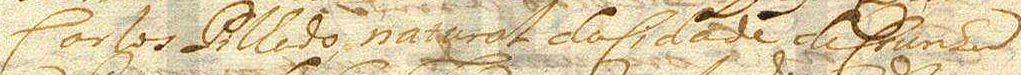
Carlos Pillado, natural da Cidade de Crunha
